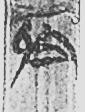於
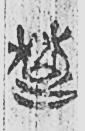楚
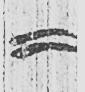二
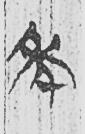年
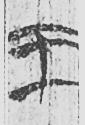王
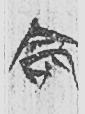命
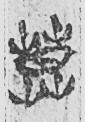莫
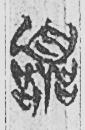囂
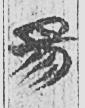昜
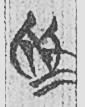爲
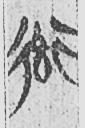率
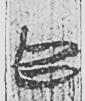𠂤
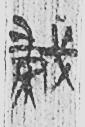{帚戈}
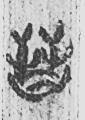晉
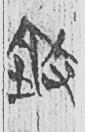{土它攴}
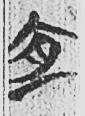宜
